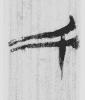民
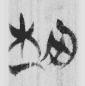埶
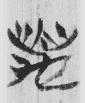萬
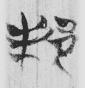邦
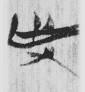拃
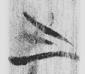之
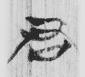君
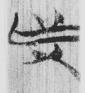拃
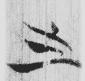之
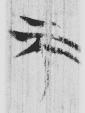帀
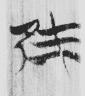隹
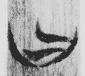曰
